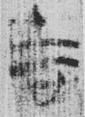吉
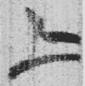上
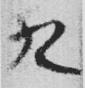九
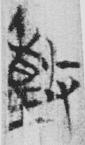○（擊）
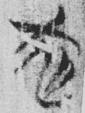○（蒙）
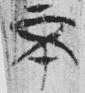不
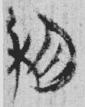利
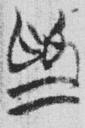爲
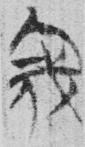○（寇）
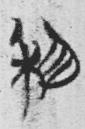利
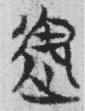○（禦）
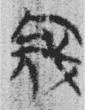○（寇）
